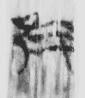隹
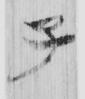子
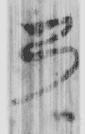乃
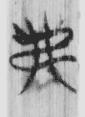弗
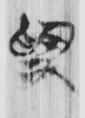受
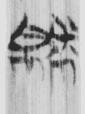{帛㡀}
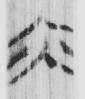亦
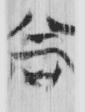尚
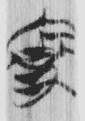{宀史}
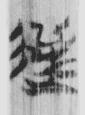逆
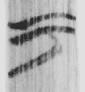于
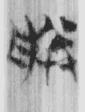朕
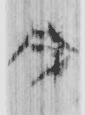凡
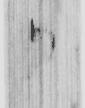人
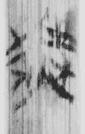無
